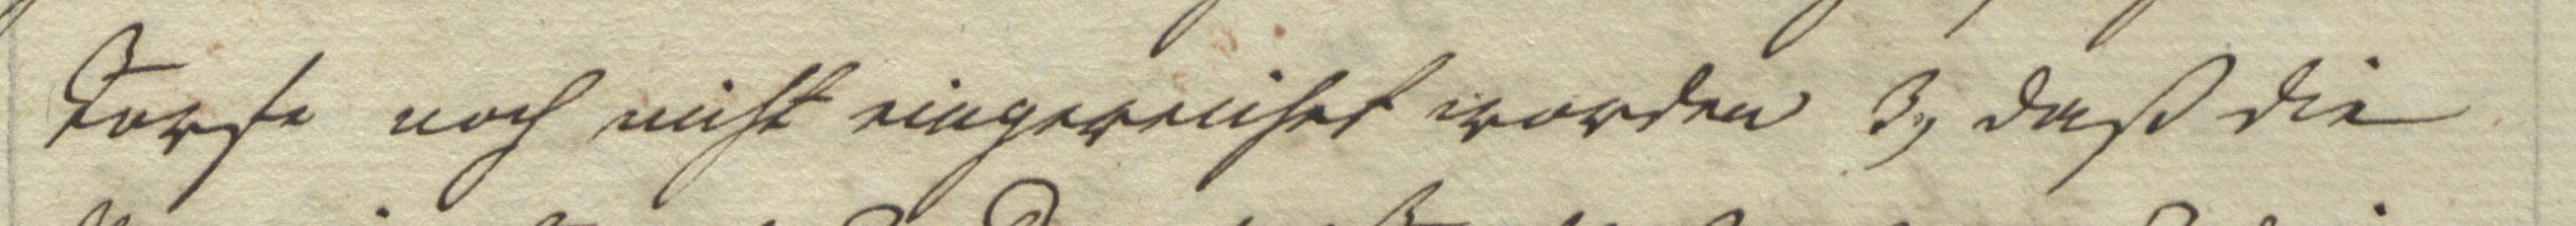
Torfe noch nicht eingereichet worden 3., daß die
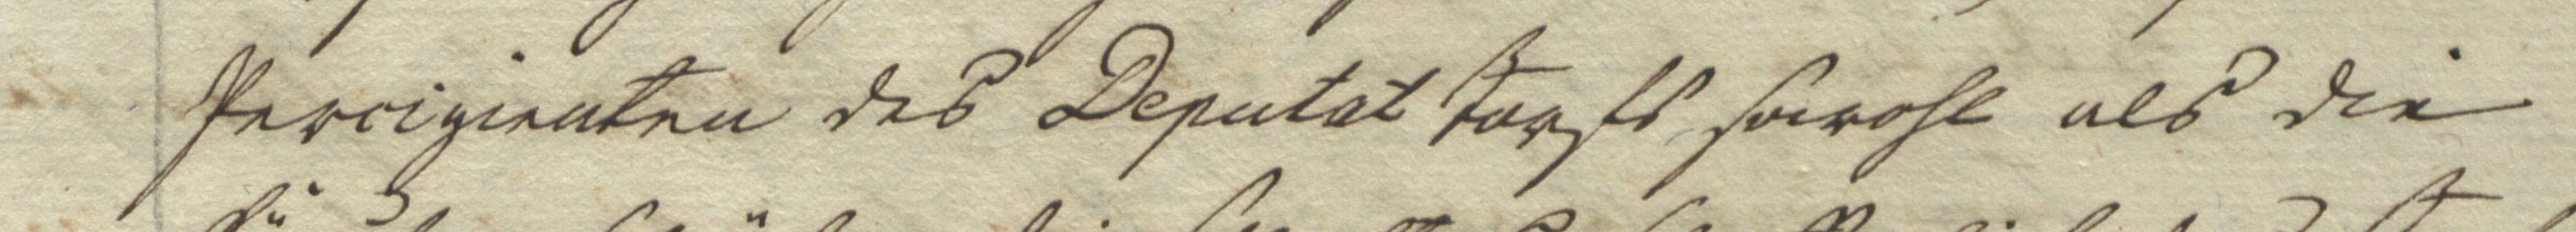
Percipienten des Deputat Torfs sowohl als die
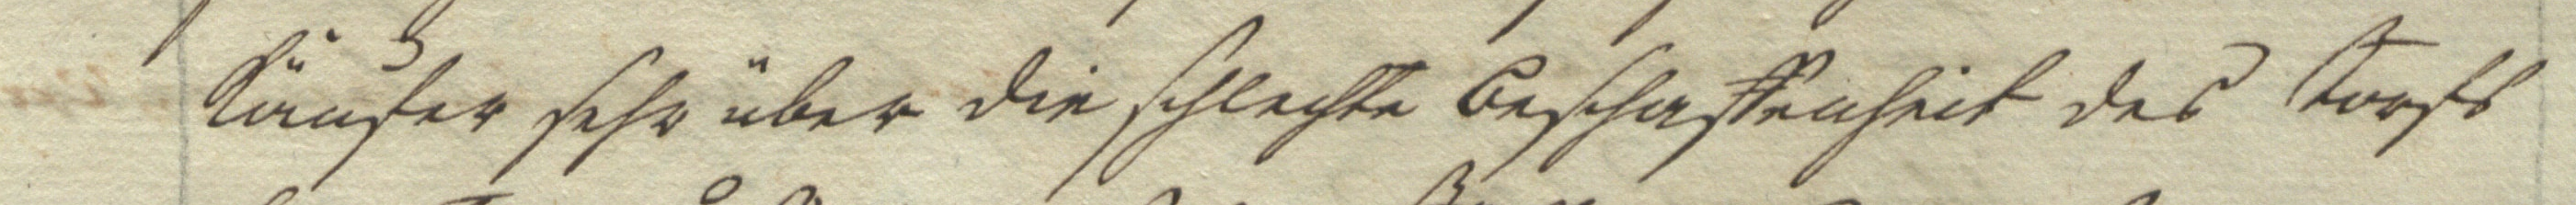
Käufer sehr über die schlechte Beschaffenheit des Torfs
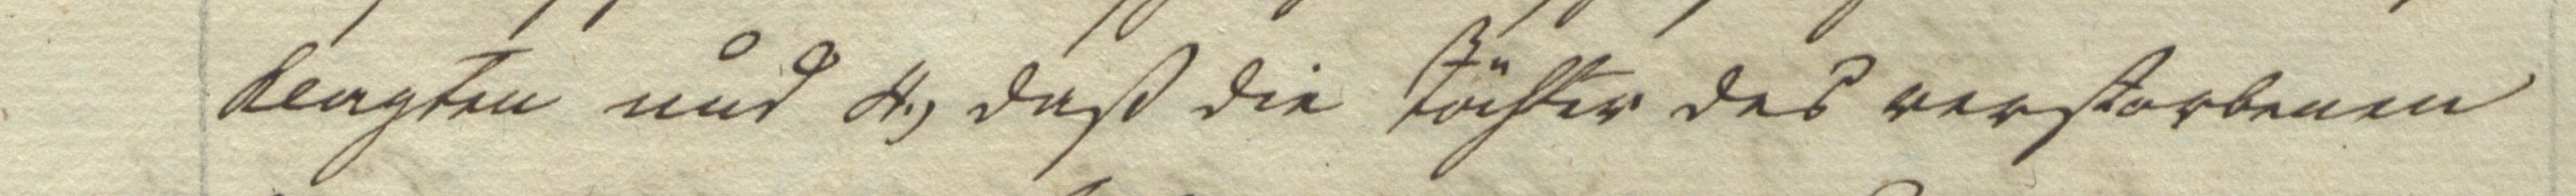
klagten und 4., daß die Töchter des verstorbenen
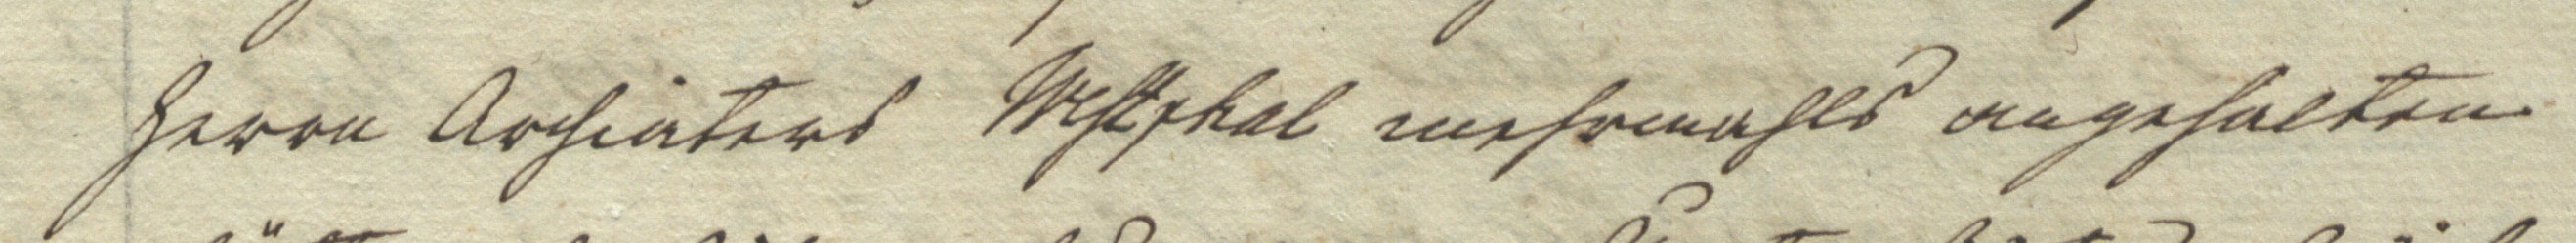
Herrn Archiaters Wesphal mehrmahls angehalten
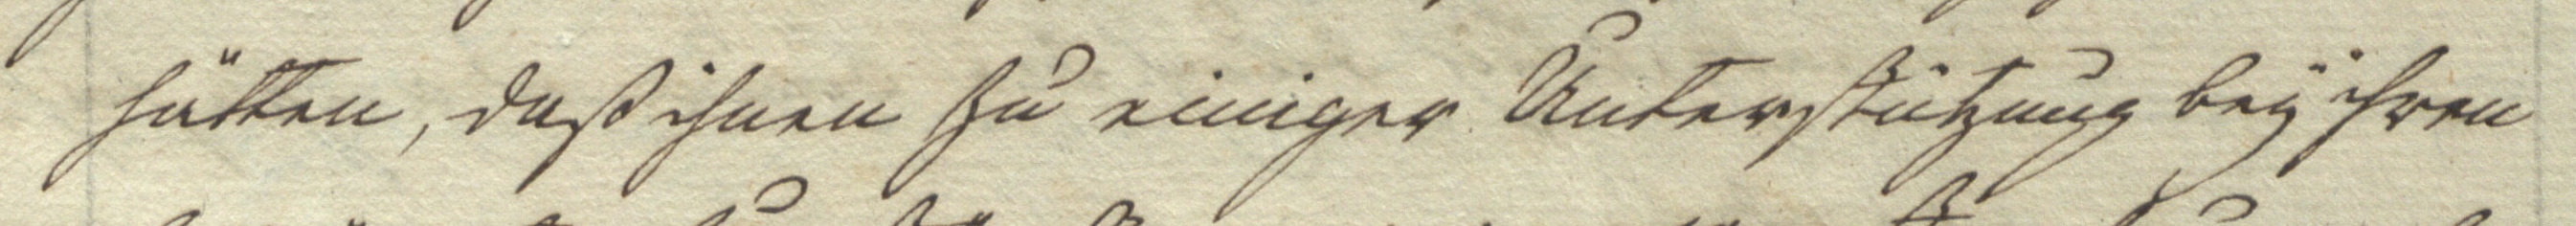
hätten, daß ihnen zu einiger Unterstützung bey ihren
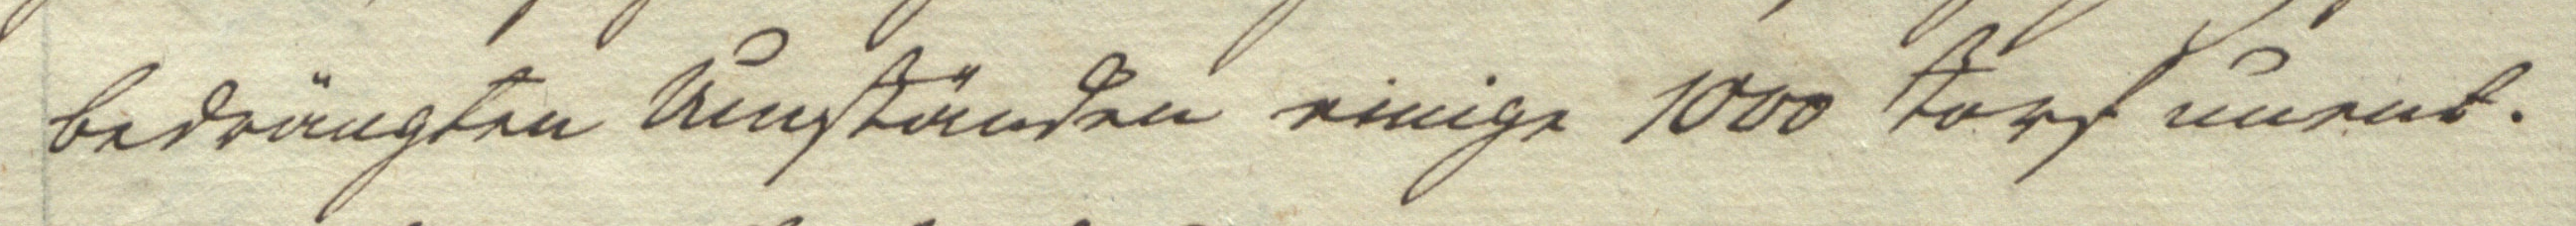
bedrängten Umständen einige 1000 Torf unent-
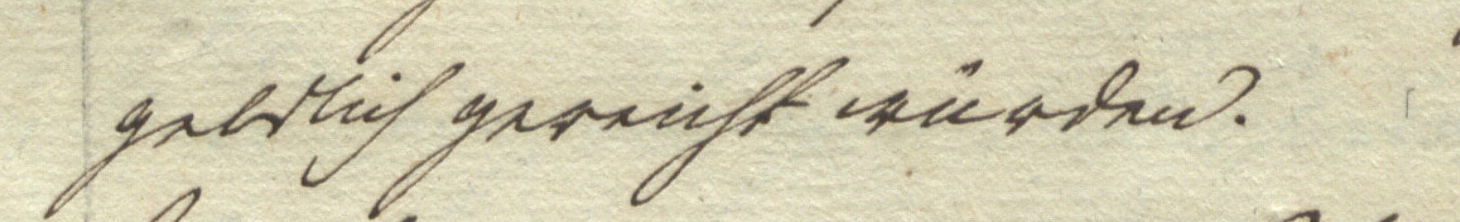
geldlich gereicht würden.
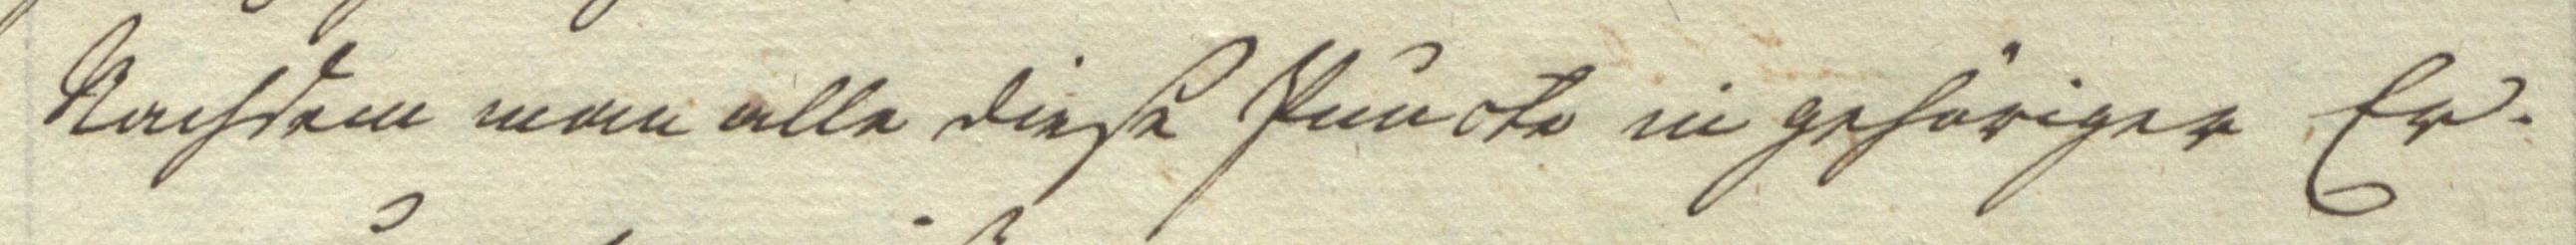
Nachdem man alle diese Puncte in gehöriger Er¬
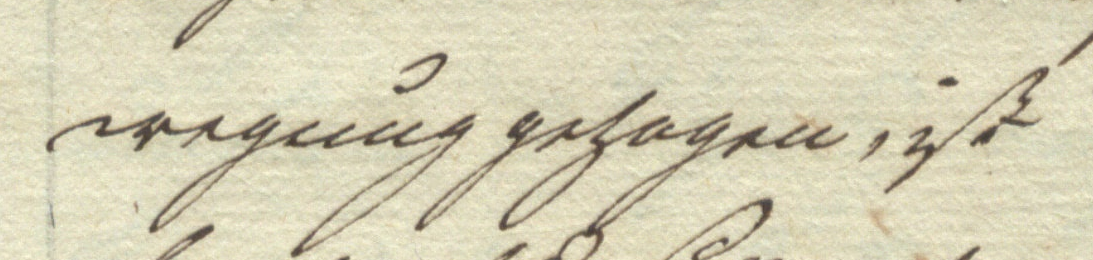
wegung gezogen ist
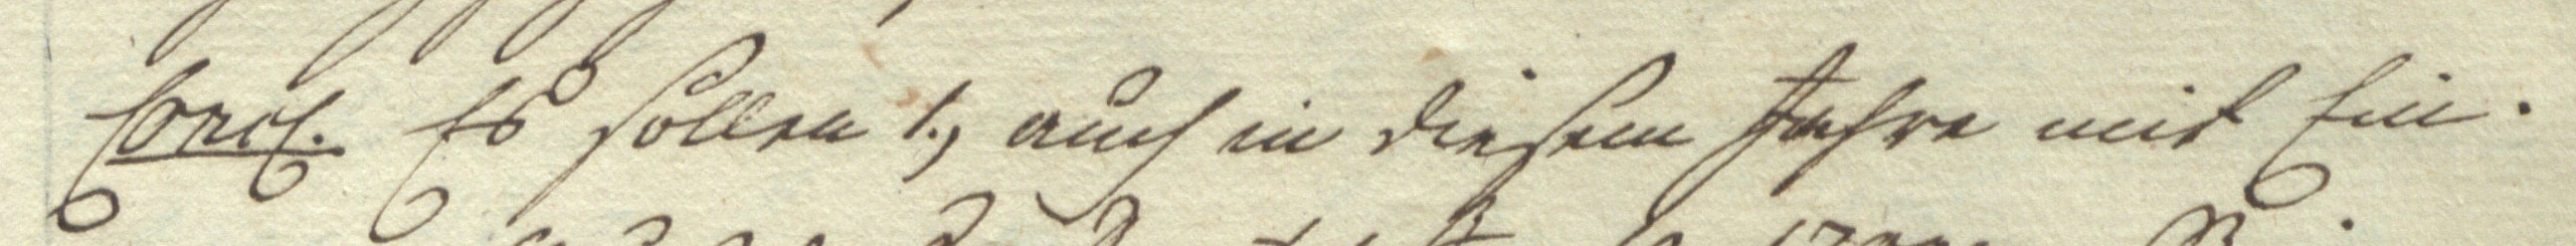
concl. Es sollen 1., auch in diesem Jahre mit Ein¬
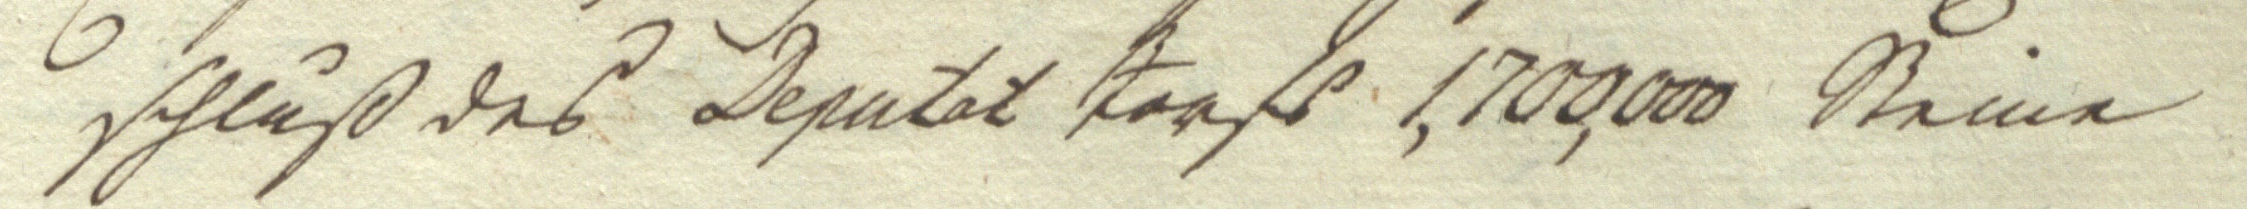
schluß des Deputat Torfs 1,700,000 Steine
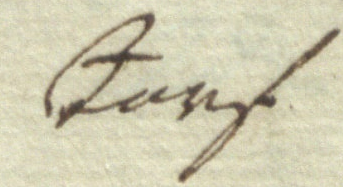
Torf
